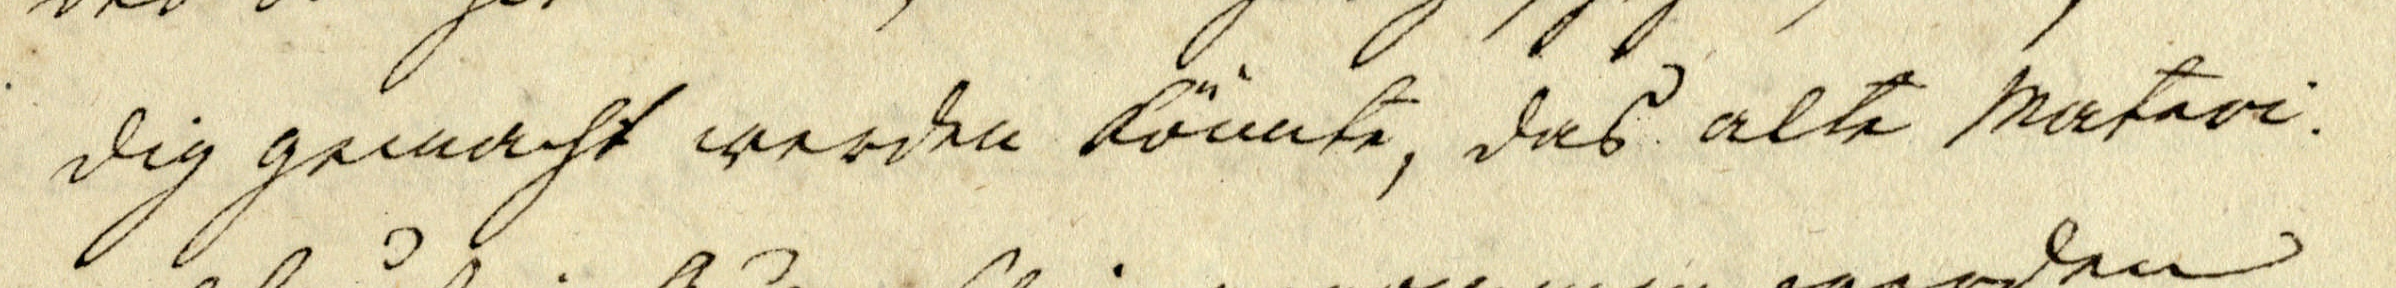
dig gemacht werden könnte, das alte Materi¬
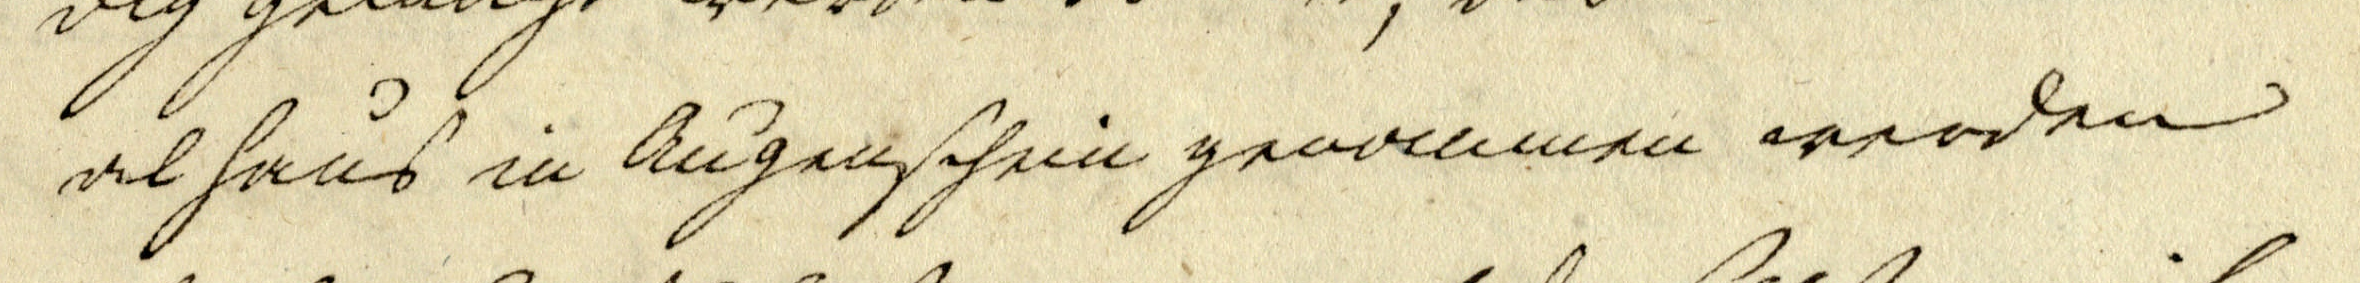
alhaus in Augenschein genommen werden
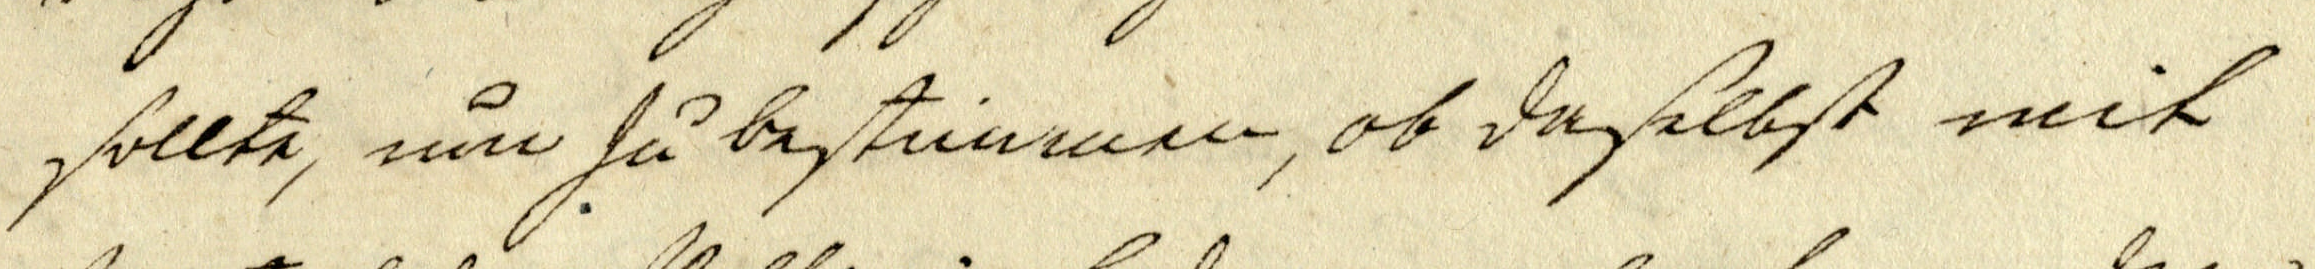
sollte, um zu bestimmen, ob daselbst mit
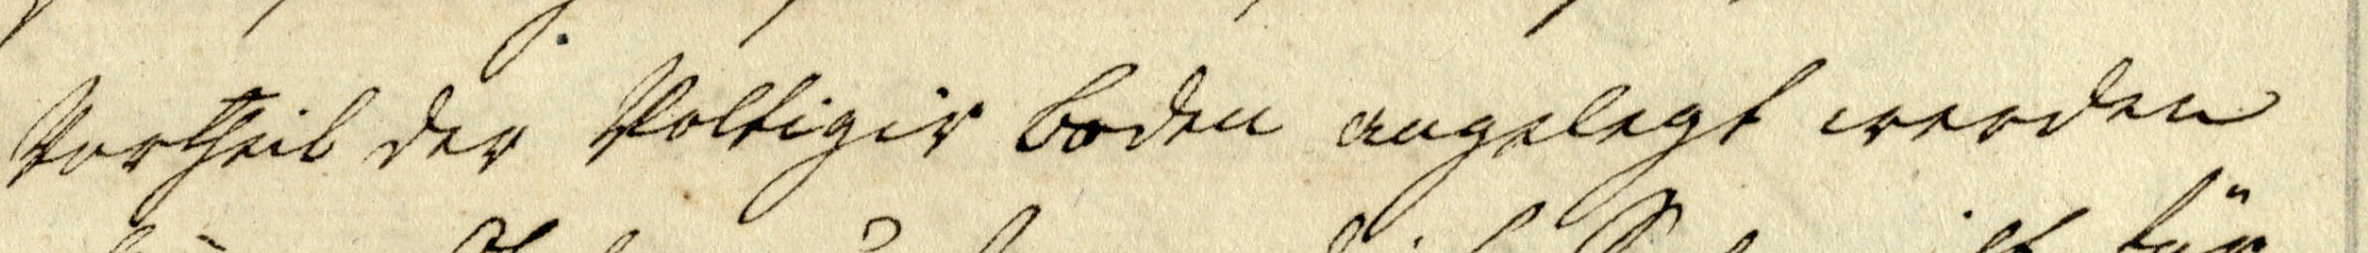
Vortheil der Voltigir Boden angelegt werden
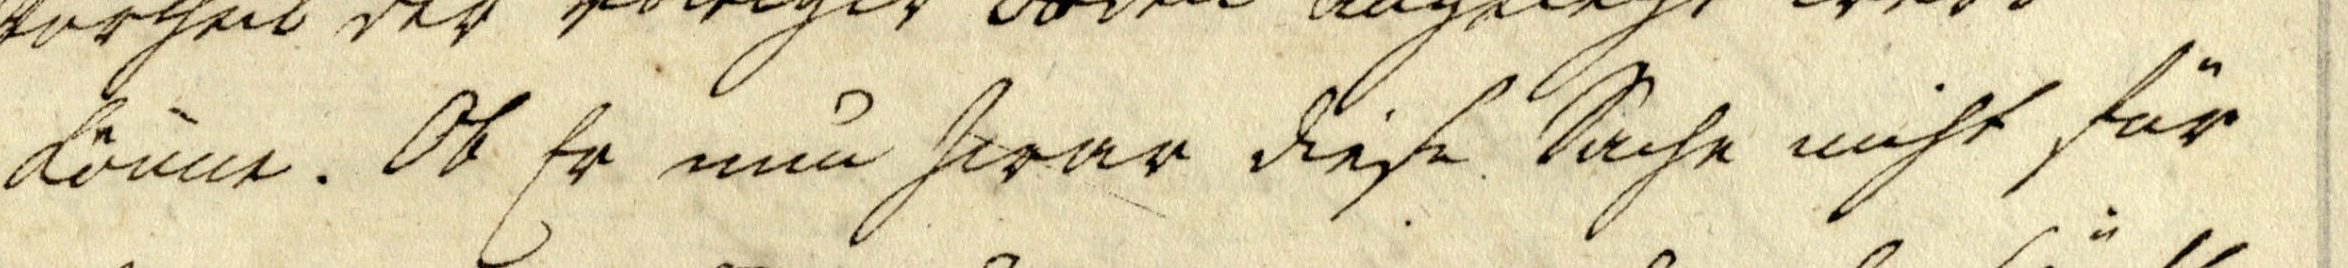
könne. Ob Er nun zwar diese Sache nicht für
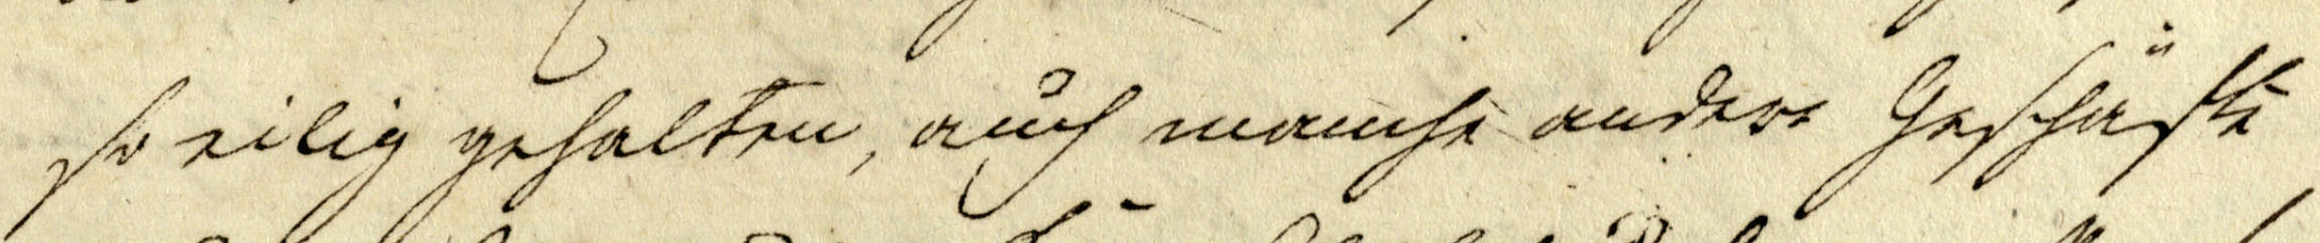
so eilig gehalten, auch manche andere Geschäfte
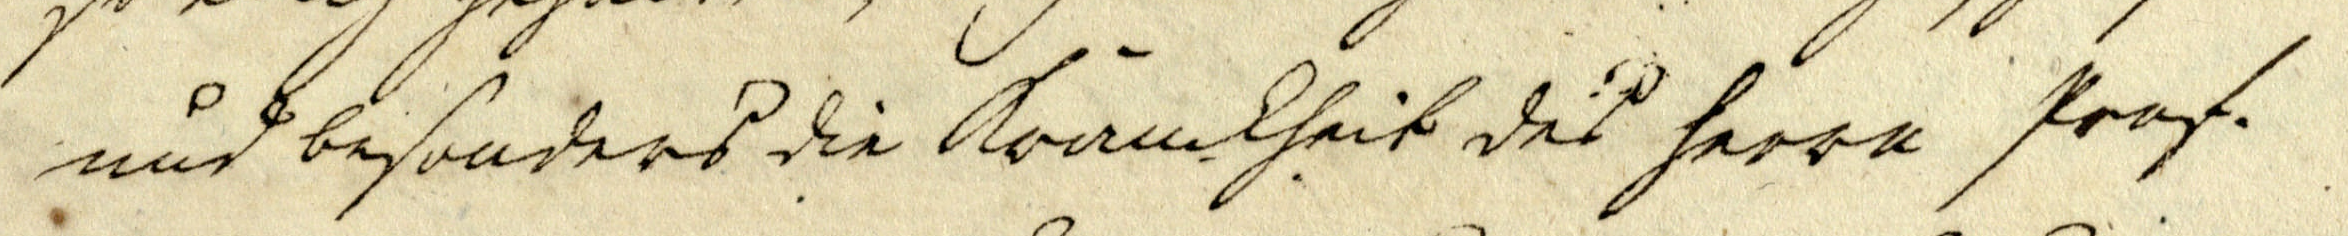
und besonders die Kranckheit des Herrn Prof.
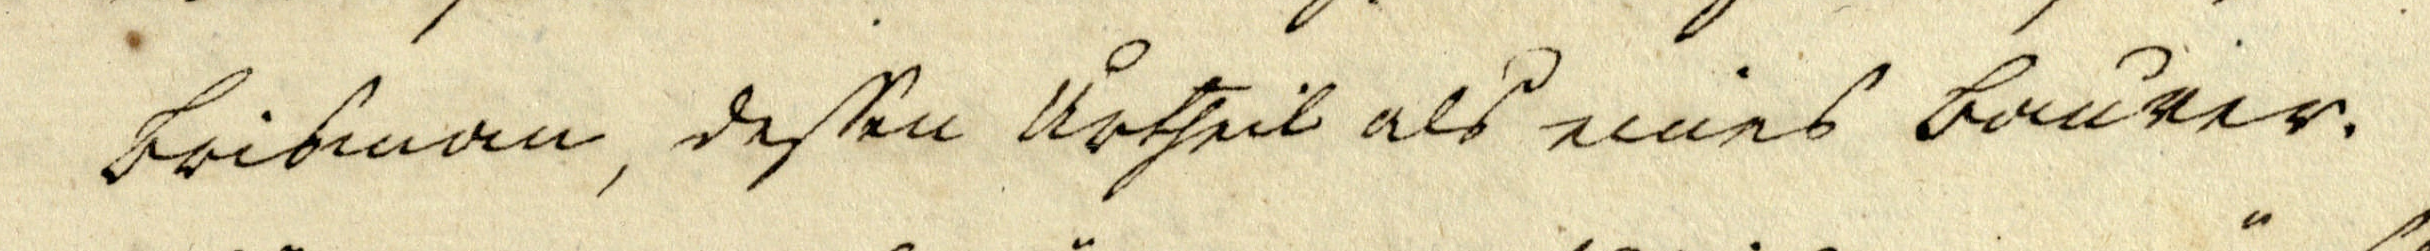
Brisman, dessen Urtheil als eines Bauver¬
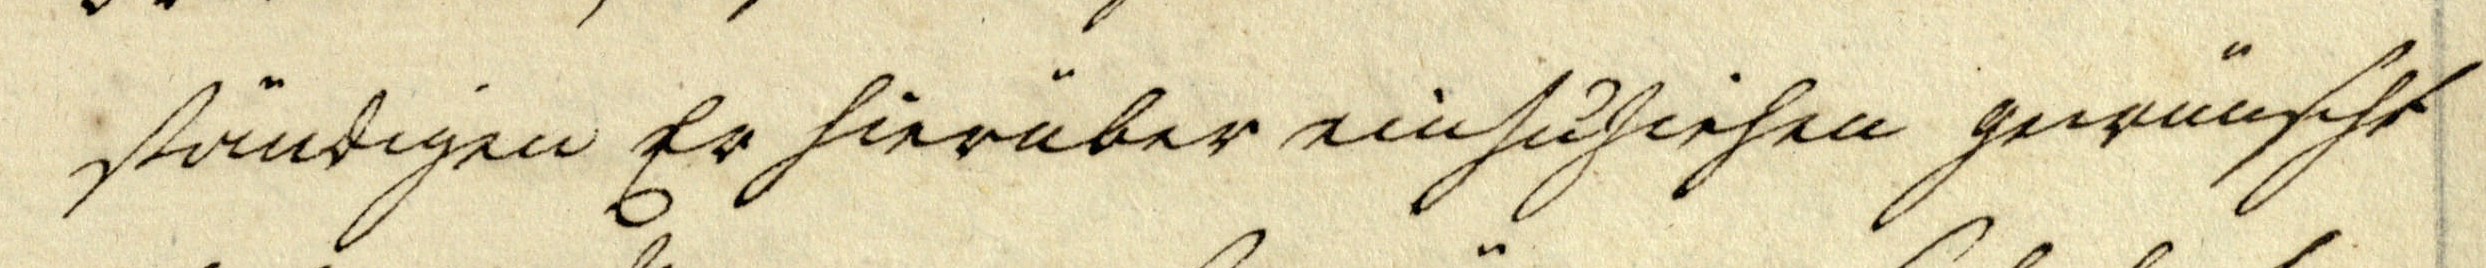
ständigen Er hierüber einzuziehen gewünscht
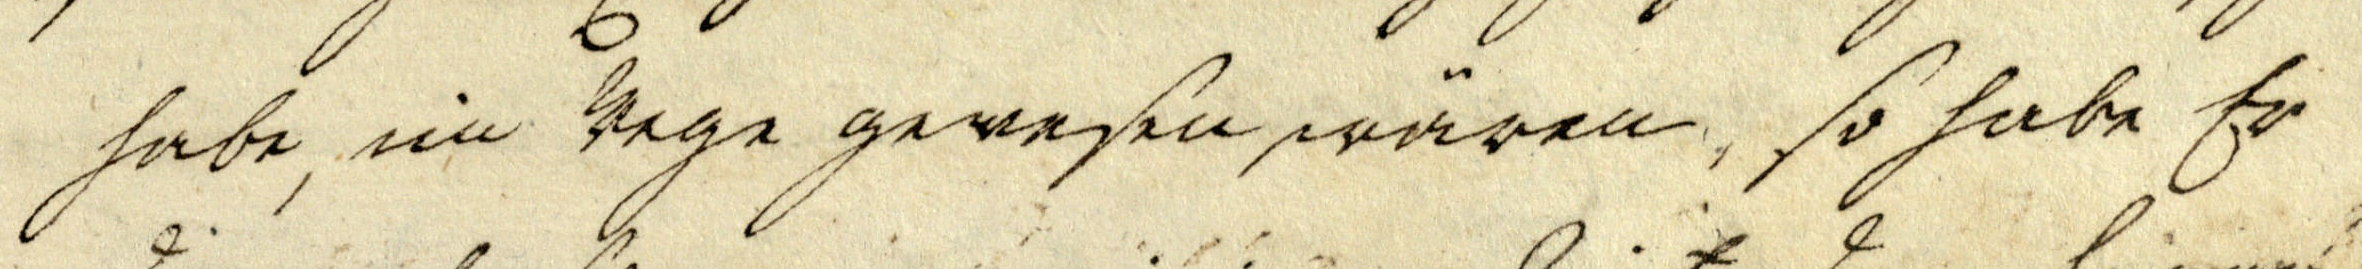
habe, im Wege gewesen wären, so habe Er
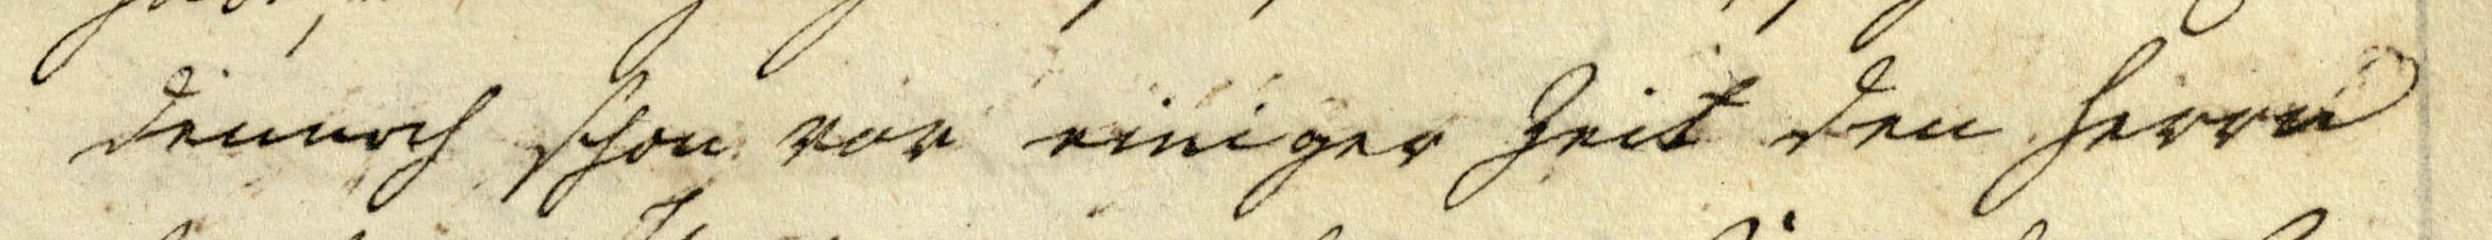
dennoch schon vor einiger Zeit den Herrn
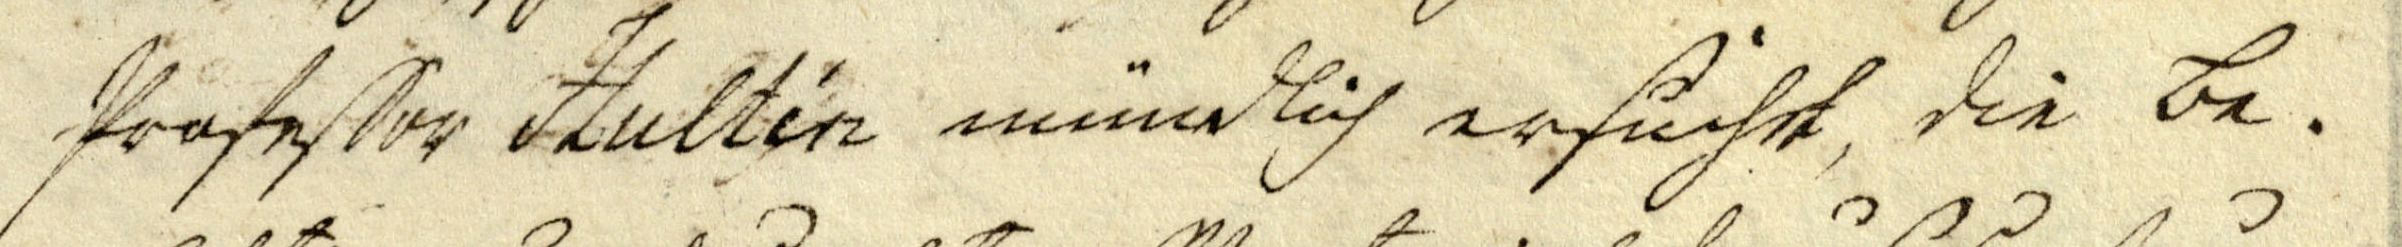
Professor Hultén mündlich ersuchet, die Be¬
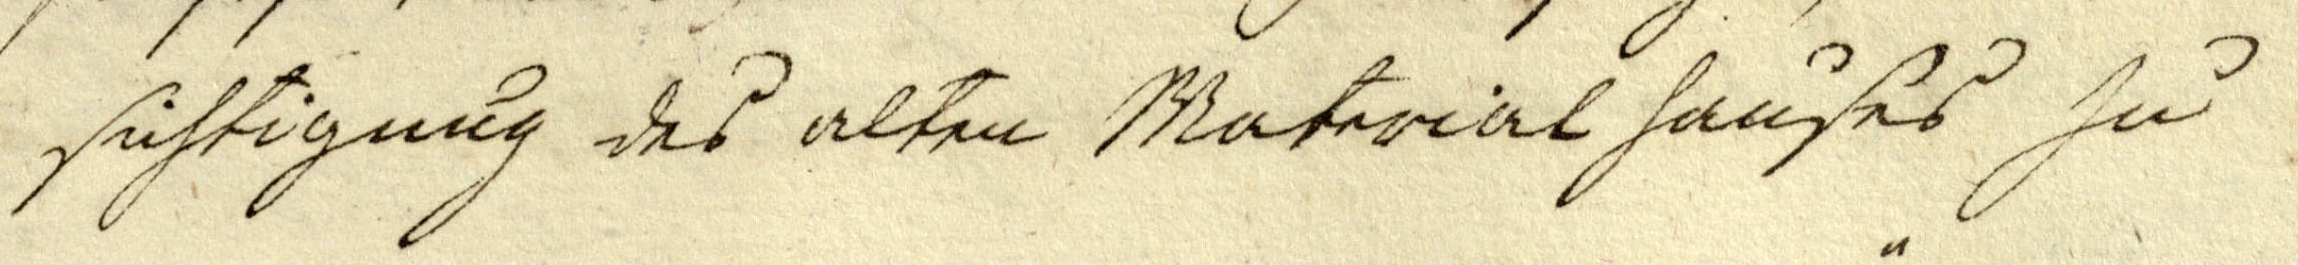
sichtigung des alten Material Hauses zu
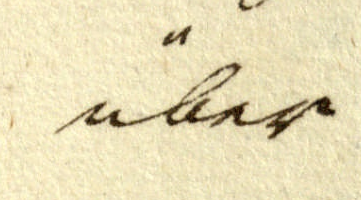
über
